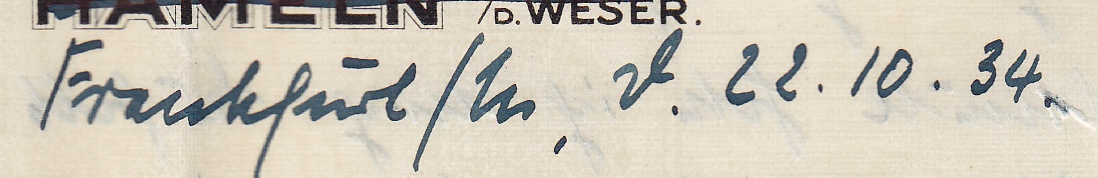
Frankfurt / M, d. 22.10.34
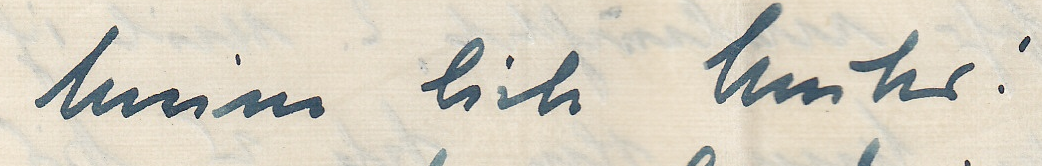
Meine liebe Mutter!
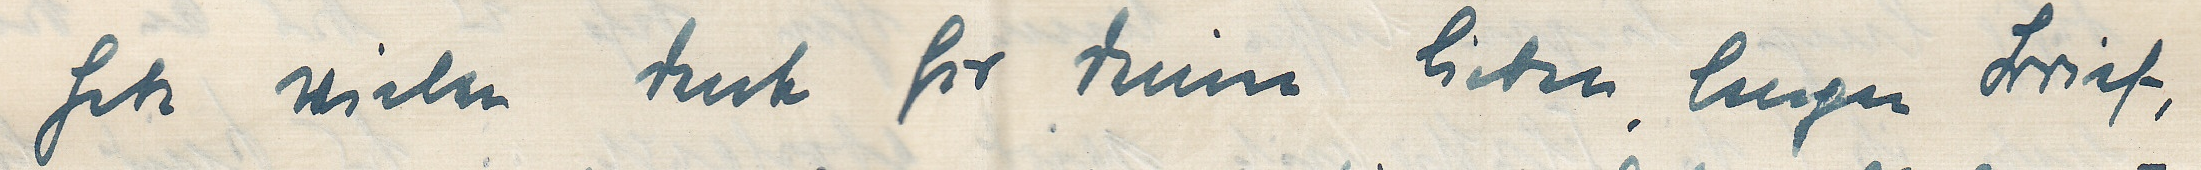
Hab vielen Dank für Deinen lieben, langen Brief,
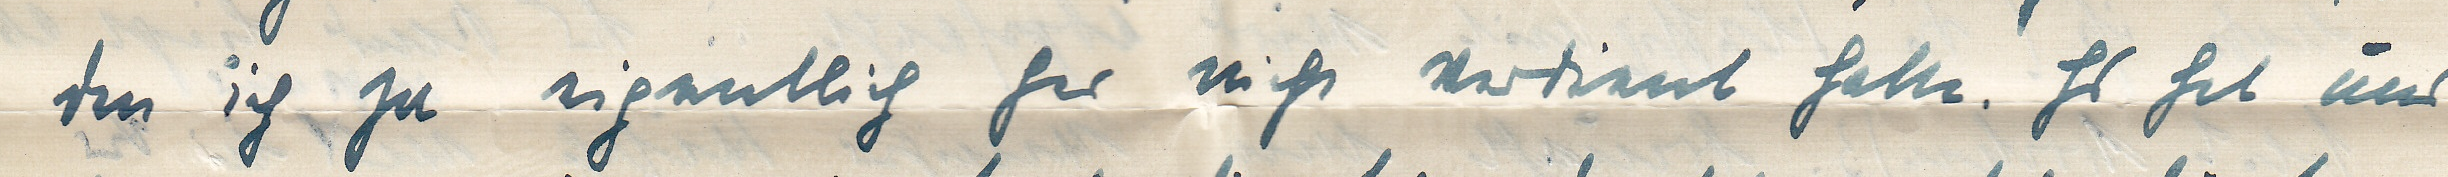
den ich zu eigentlich für mich ???
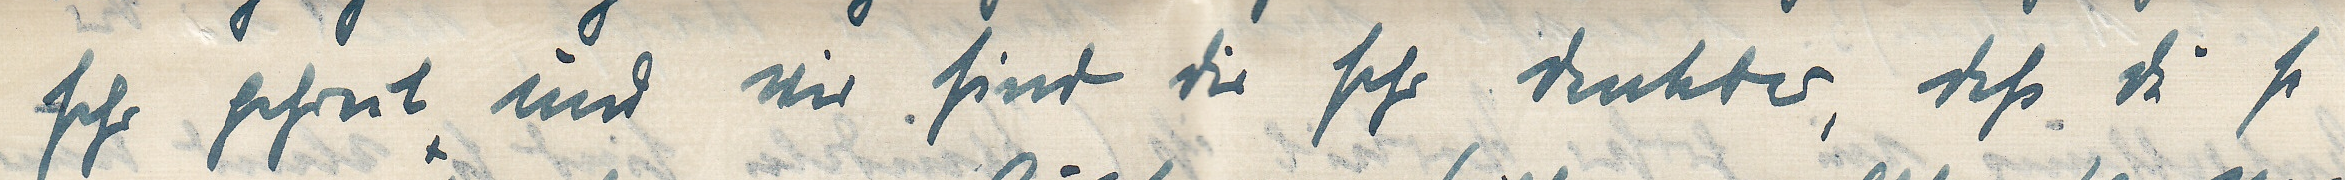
Ich ??? und wir sind die
